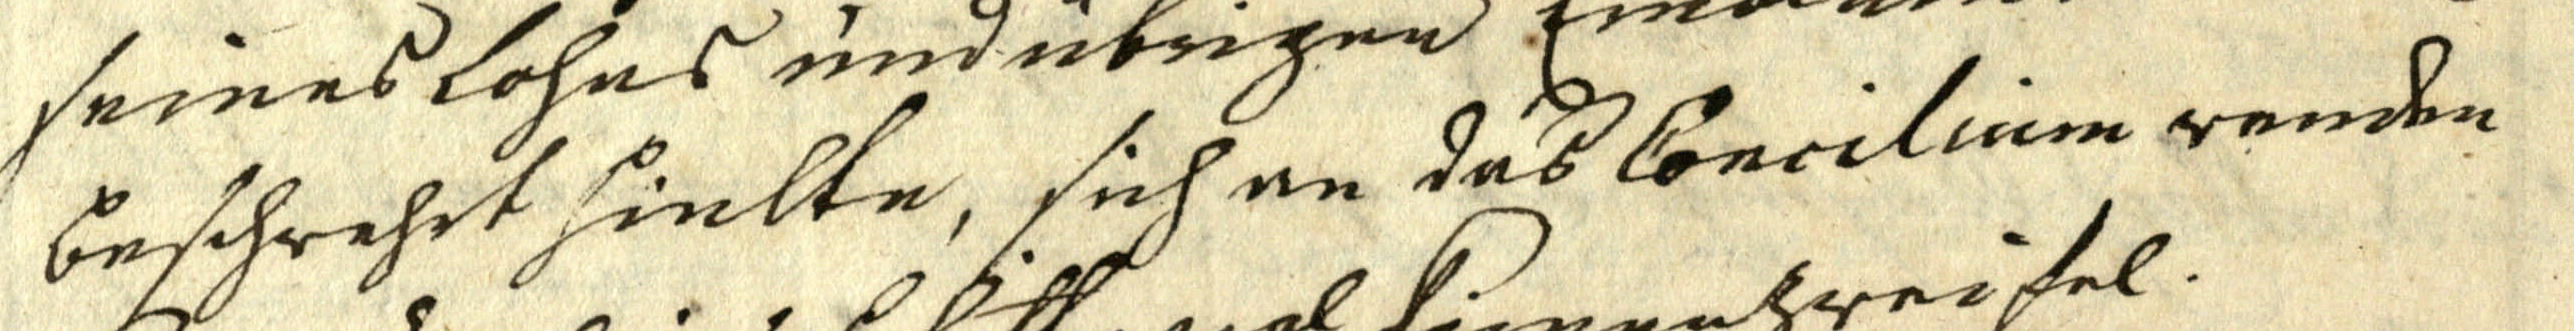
beschwehrt hielte, sich an das Concilium wenden
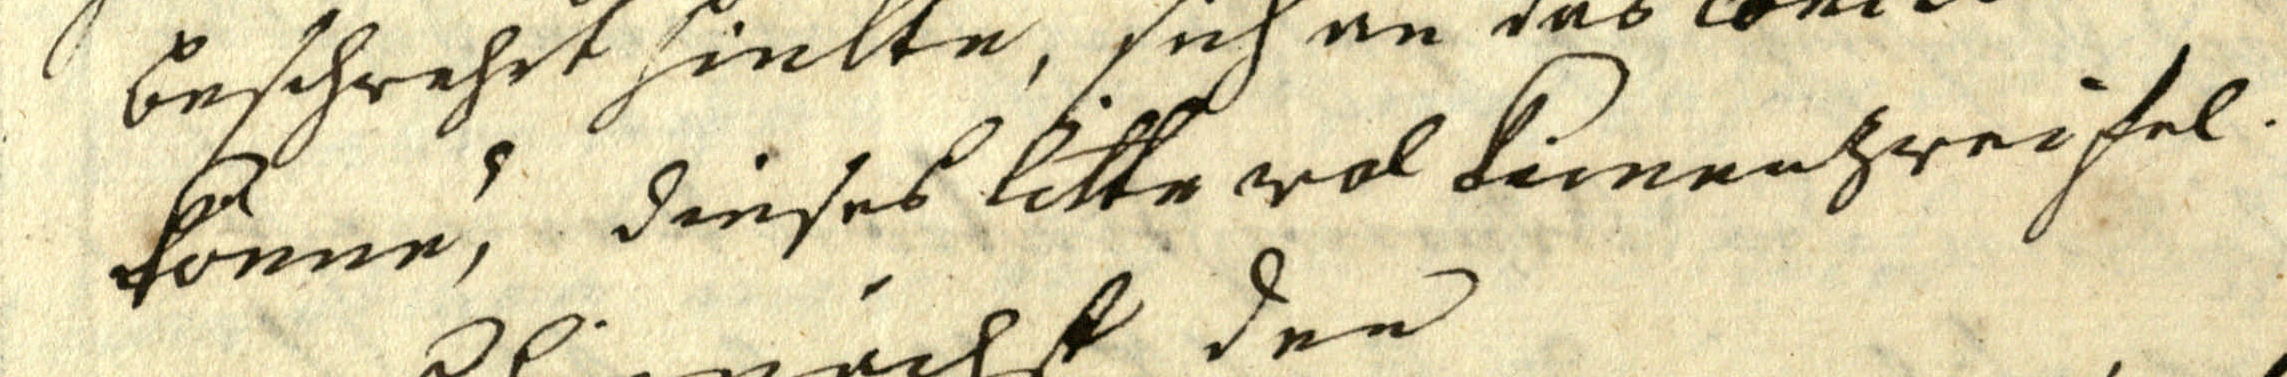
könne? dieses litte wol keinen Zweifel.
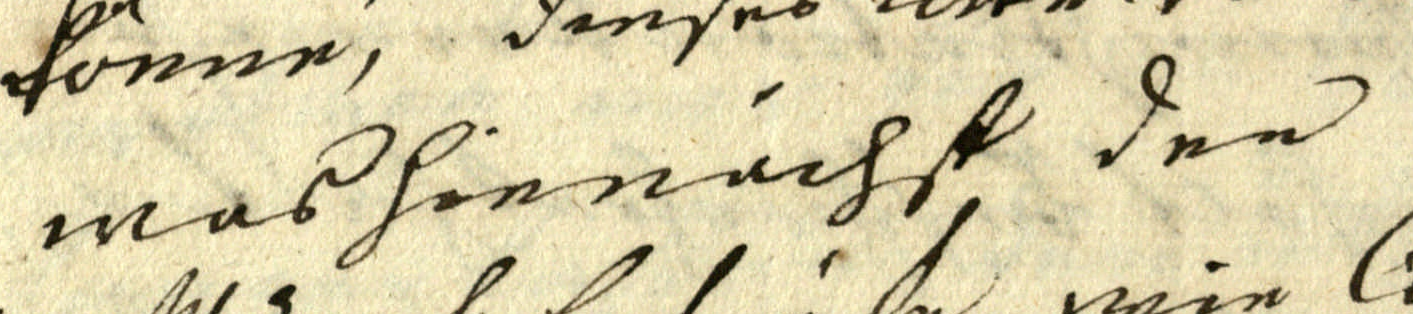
was hienächst den
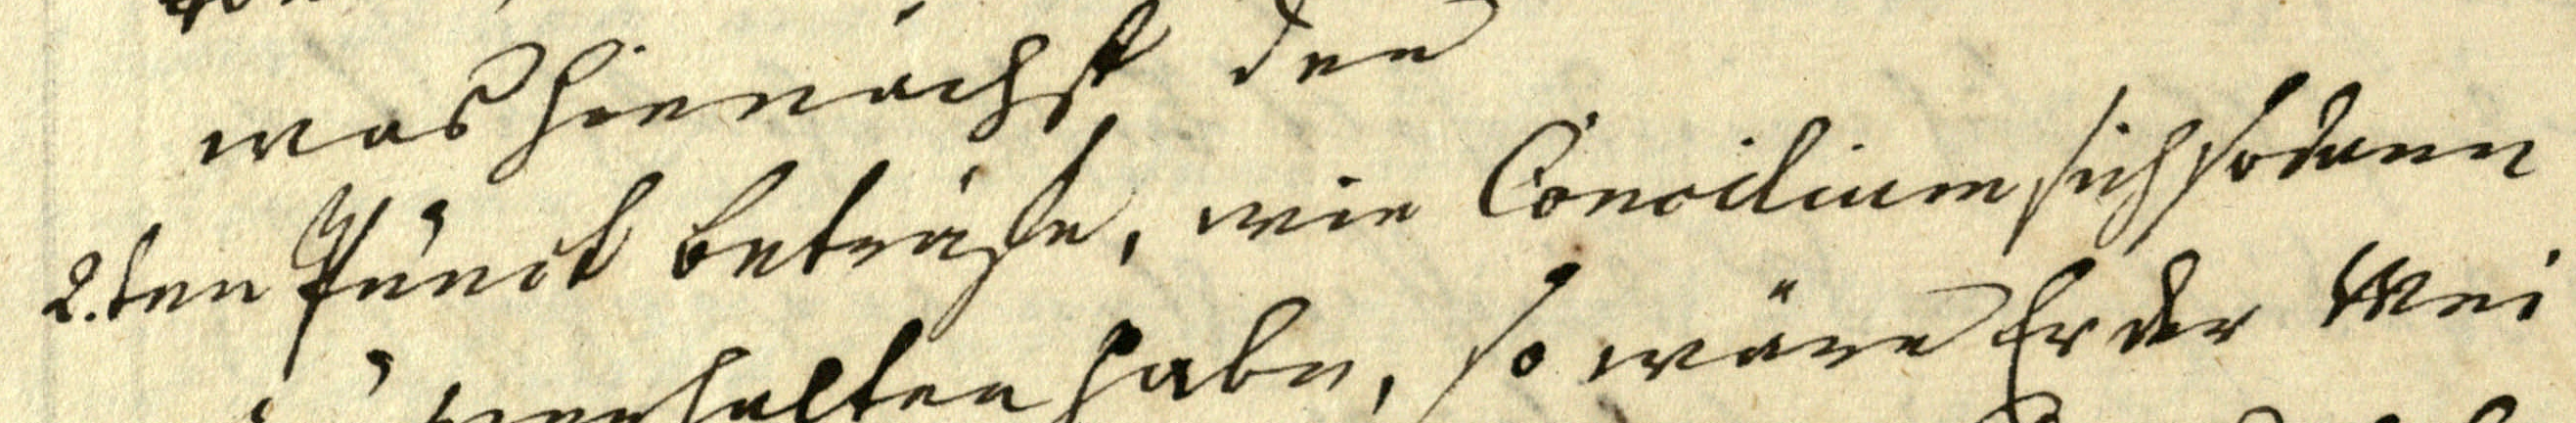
2ten Punct beträfe, wie Concilium sich sodann
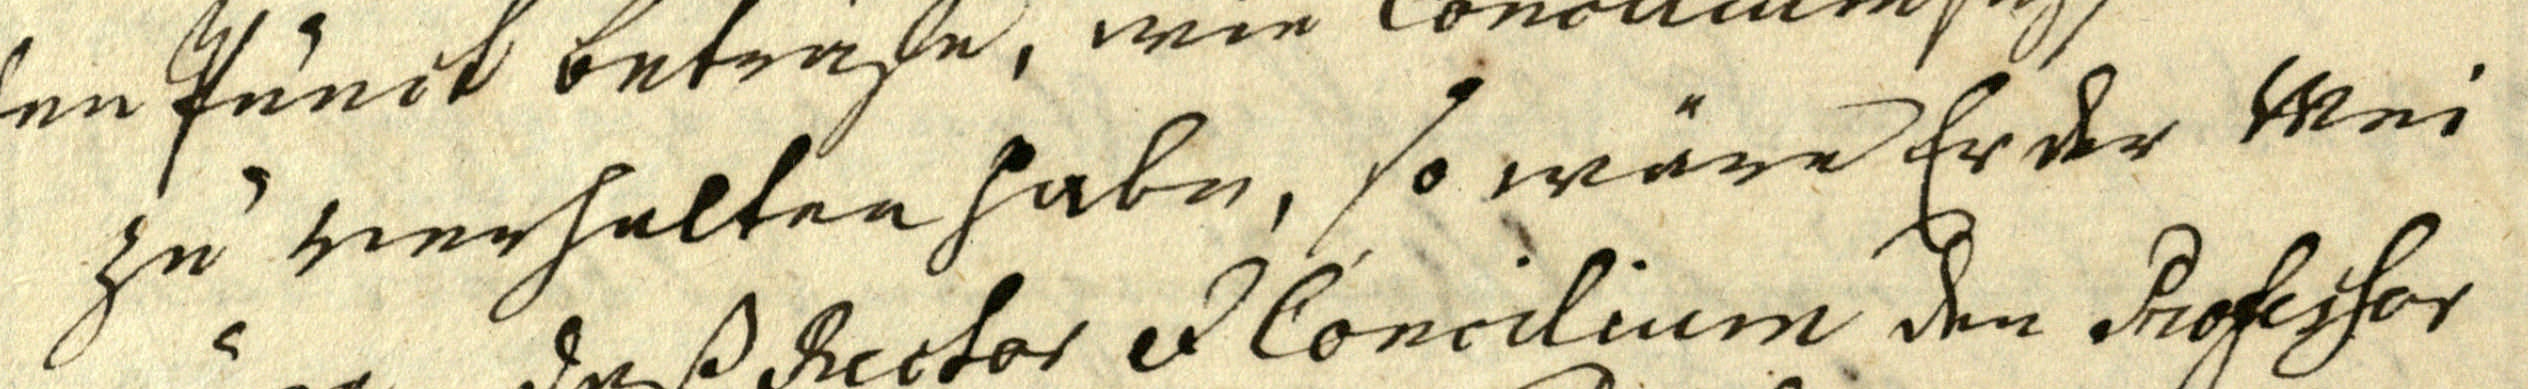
zu verhalten habe, so wäre Er der Mei¬
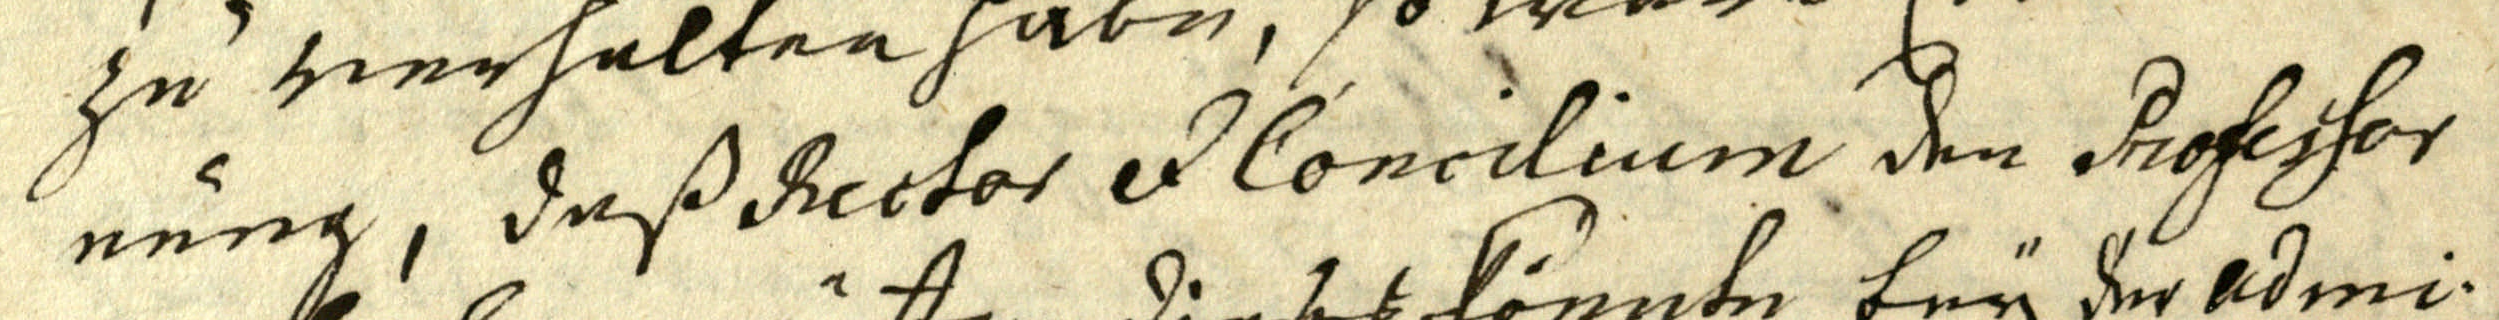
nung, daß Rector et Concilium den Professor
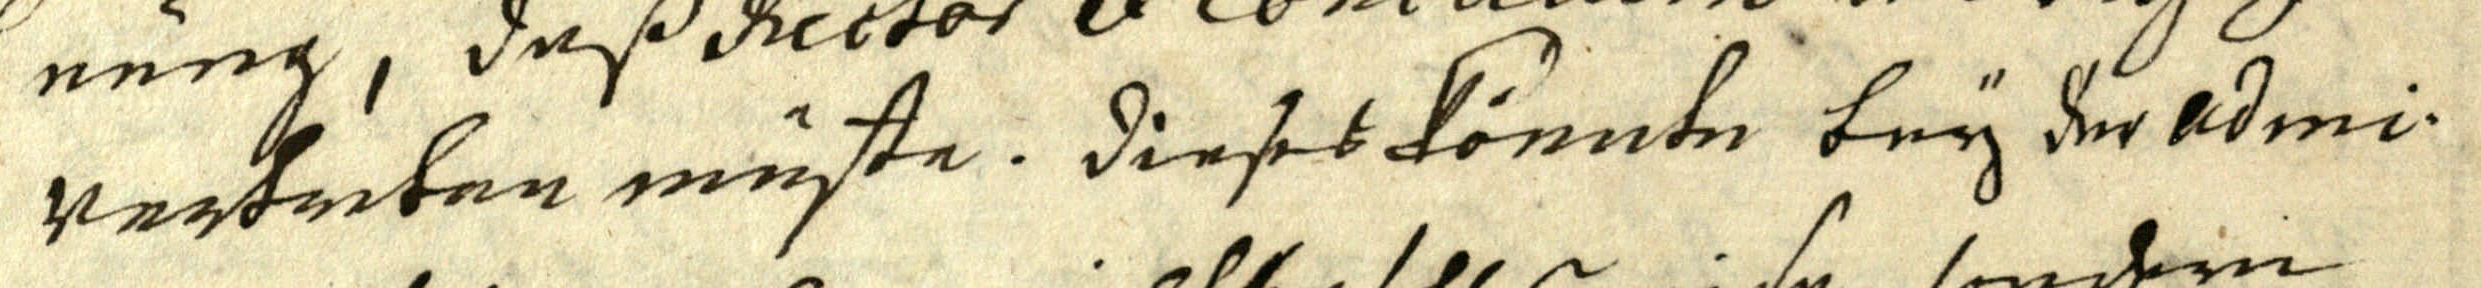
vertreten müste. Dieses könnte beÿ er Admi¬
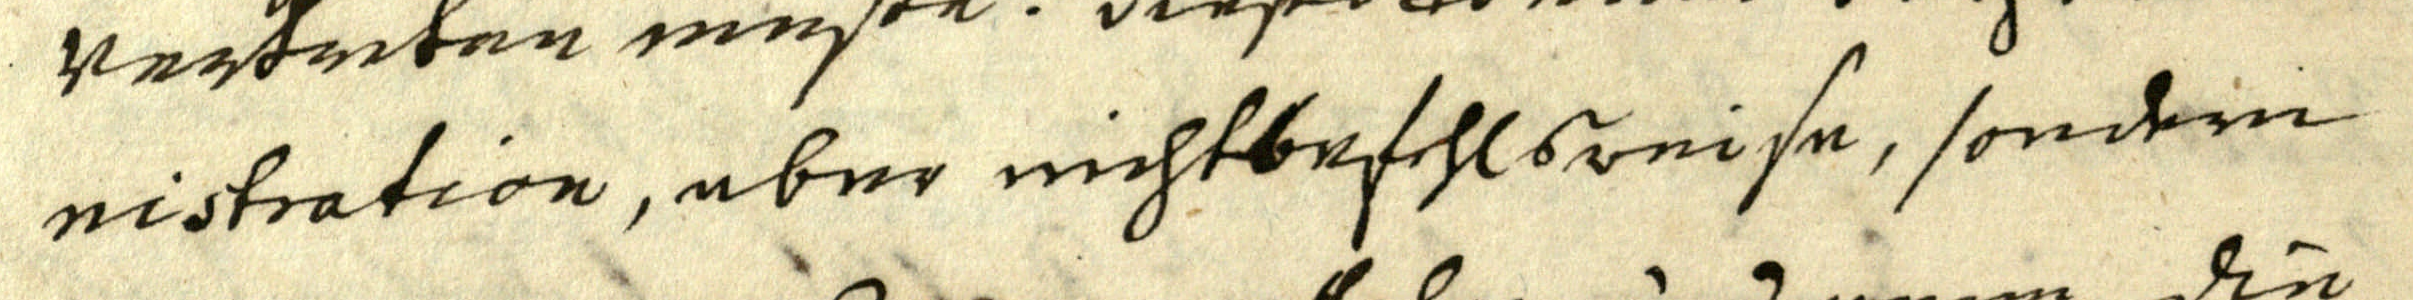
nistration, aber nicht befehlsweise, sondern
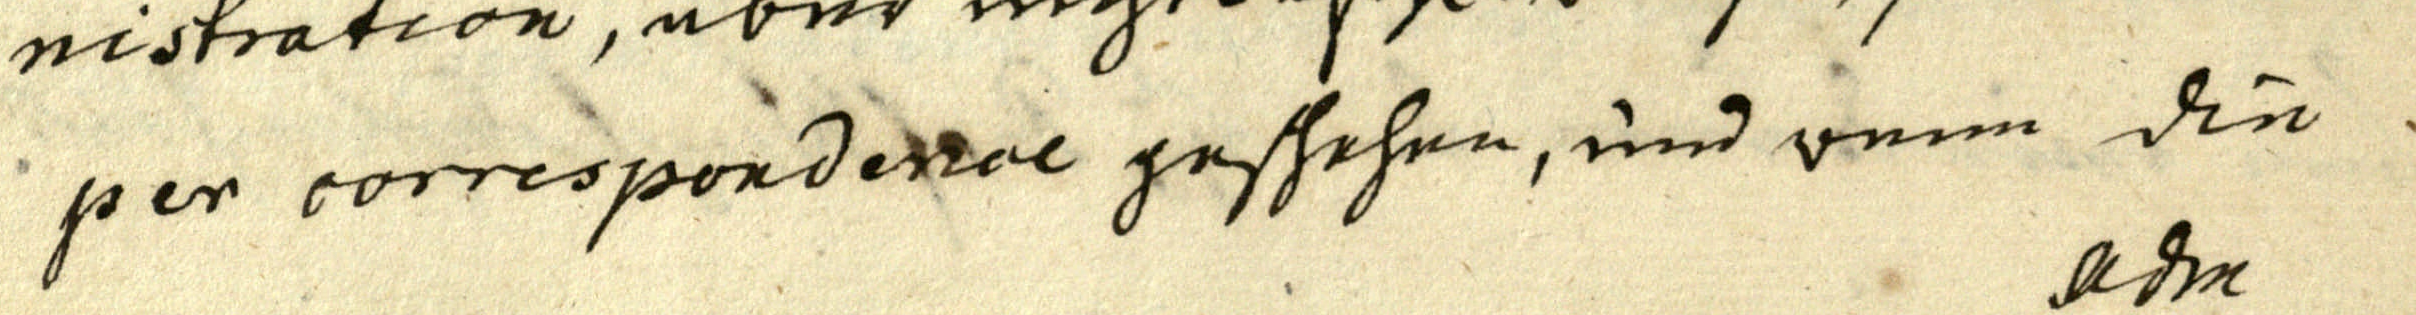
per correspondence geschehen, und wenn die
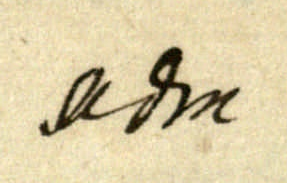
Adm
